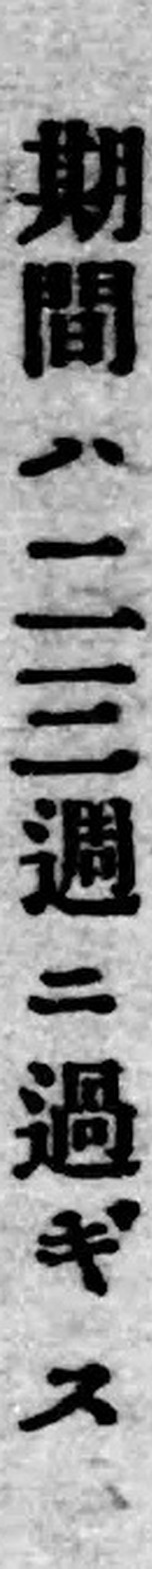期間ハ二三週ニ過ギス
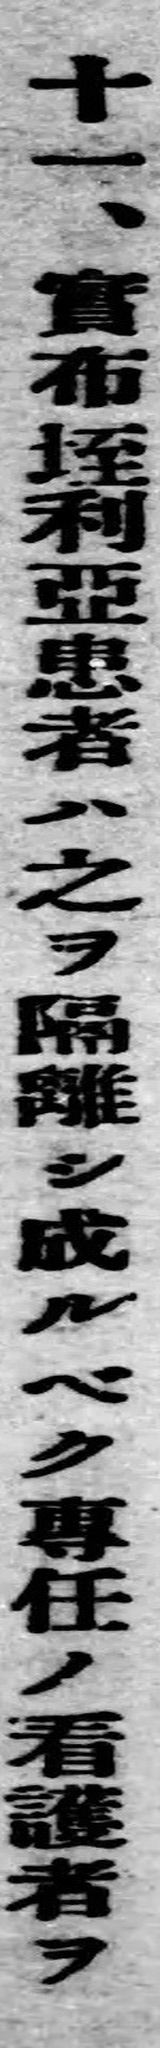十一、實布垤利亞患者ハ之ヲ隔離シ成ルベク専任ノ看護者ヲ
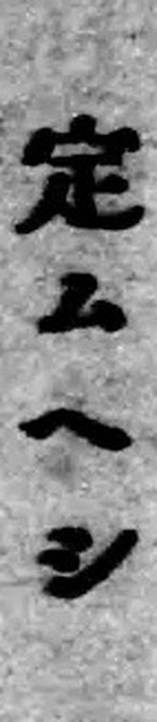定ムヘシ

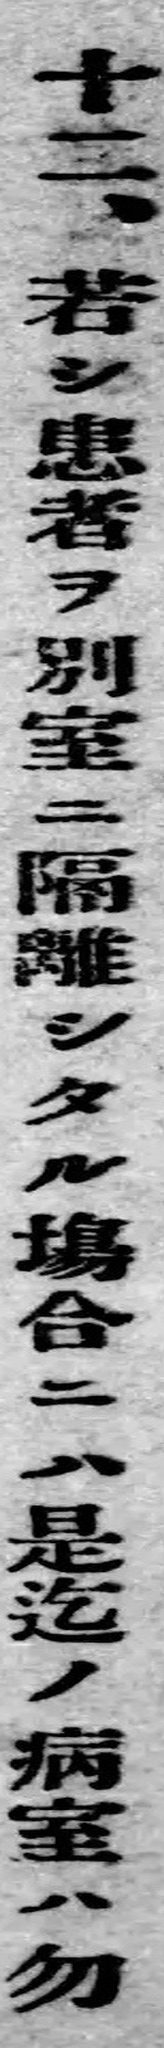十二、若シ患者ヲ別室ニ隔離シタル塲合ニハ是迄ノ病室ハ勿
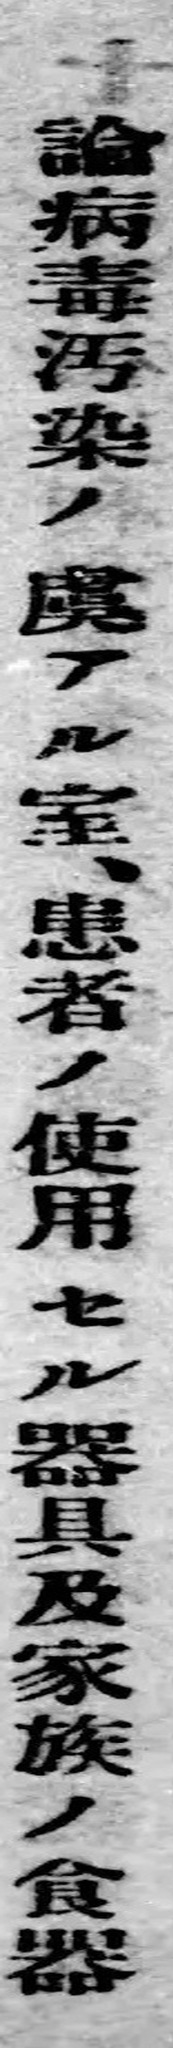論病毒汚染ノ虞アル室、患者ノ使用セル器具及家族ノ食器
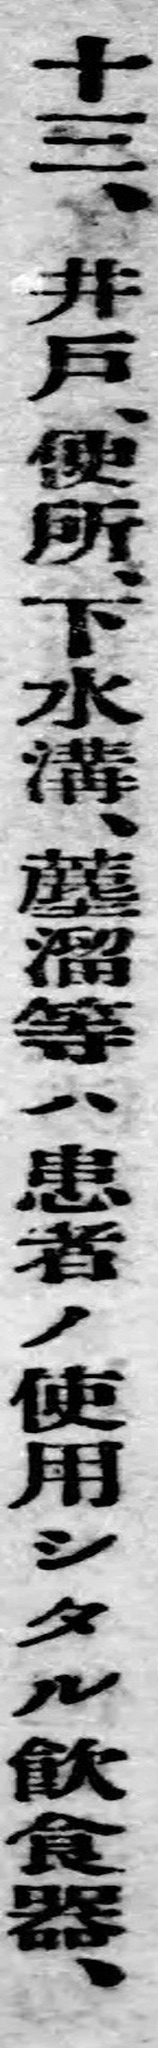十三、井戸、便所、下水溝、薼溜等ハ患者ノ使用シタル飮食器、
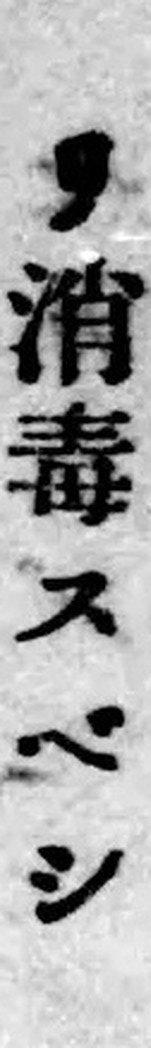リ消毒スベシ
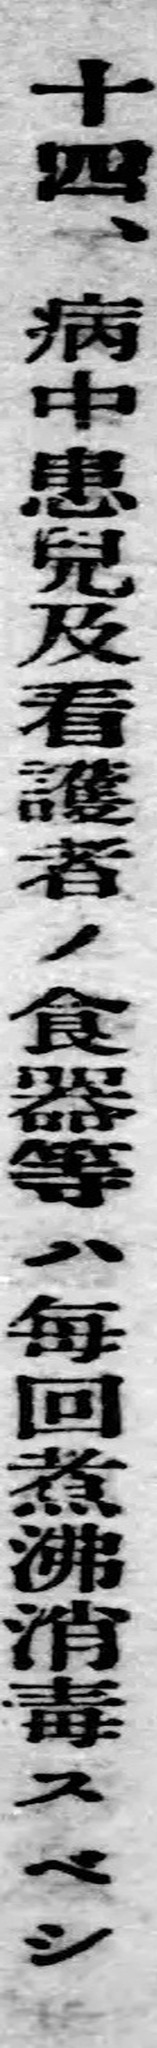十四、病中患兒及看護者ノ食器等ハ毎回煮沸消毒スベシ
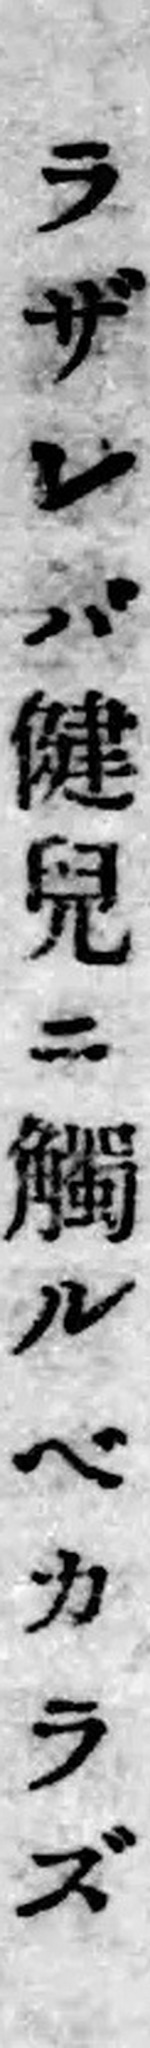ラザレバ健兒ヲ觸ルベカラズ
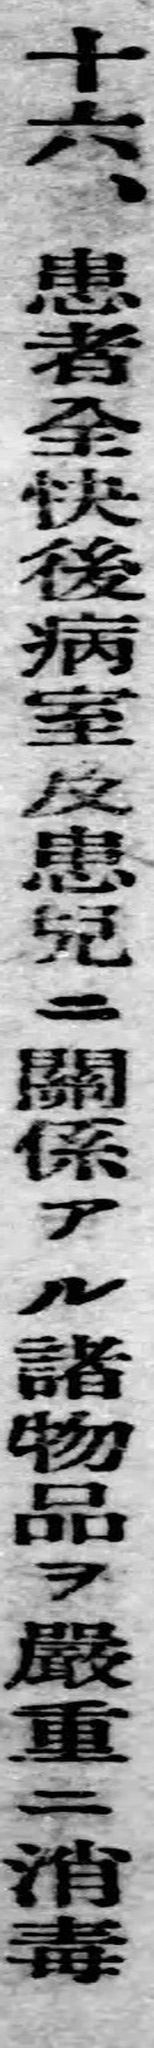十六、患者全快後病室及患兒ニ關係アル諸物品ヲ嚴重ニ消毒
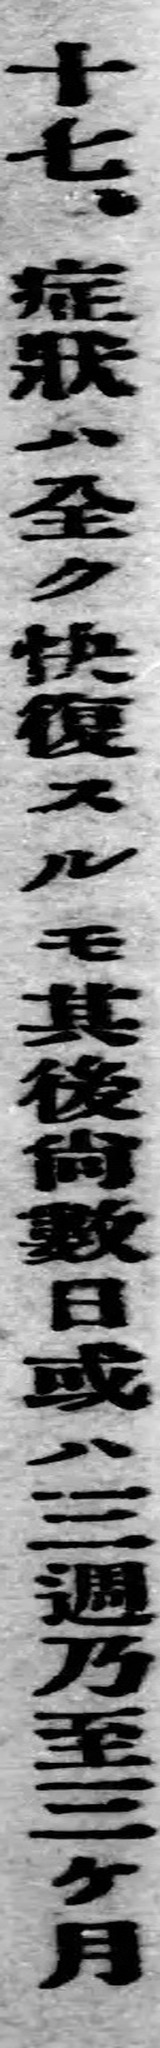十七、症狀ハ全ク快復スルモ其後尚數日或ハ三週乃至三ヶ月
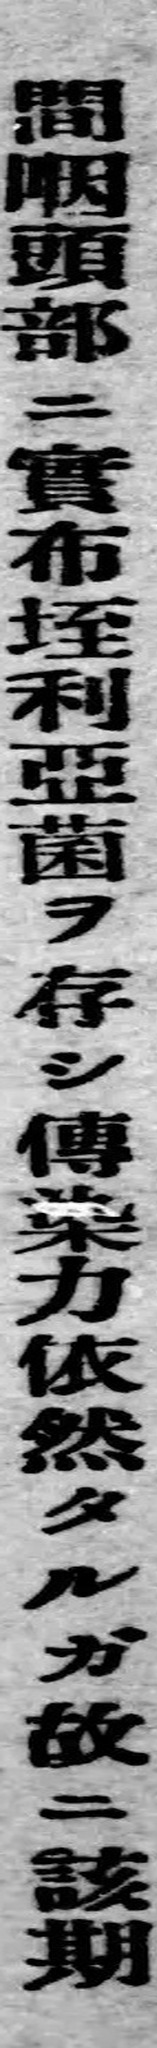間咽頭部ニ實布垤利亞菌ヲ存シ傳染力依然タルガ故ニ該期
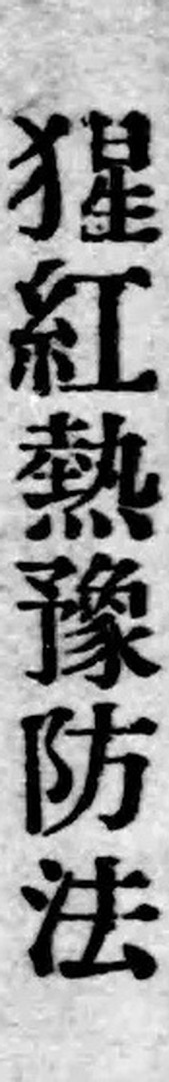猩紅熱豫防法
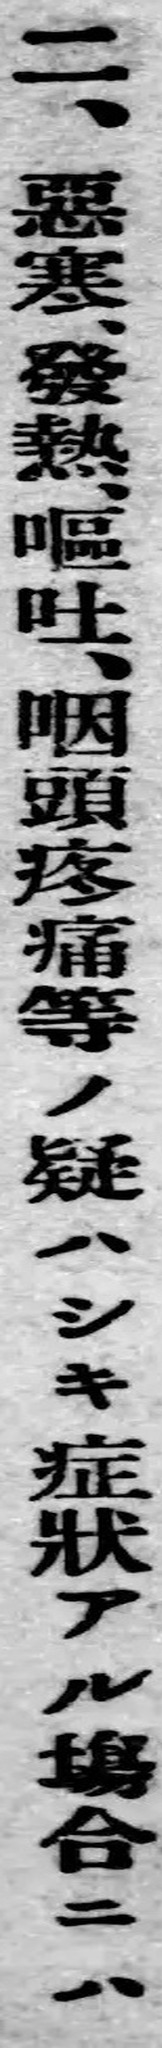二、惡寒、發熱、嘔吐、咽頭疼痛等ノ疑ハシキ症狀アル塲合ニハ

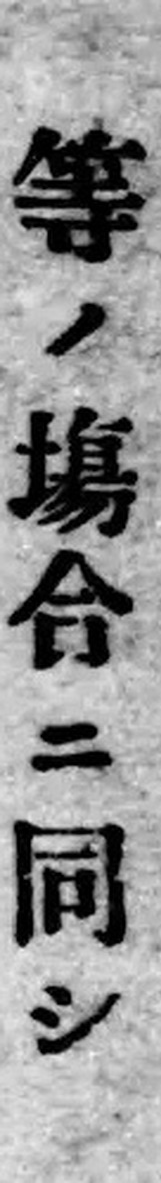等ノ塲合ニ同シ
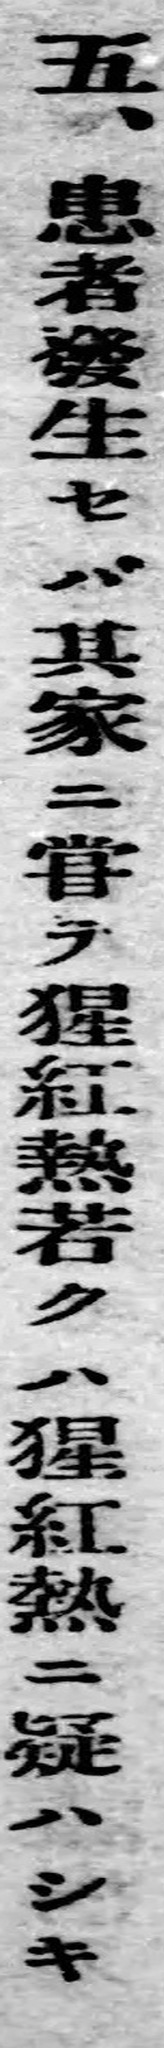五、患者發生セバ其家ニ甞テ猩紅熱若クハ猩紅熱ニ疑ハシキ
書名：袖珍防疫必携
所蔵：国立国会図書館 National Diet Library, JAPAN
